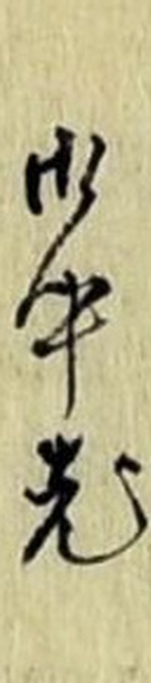御中老
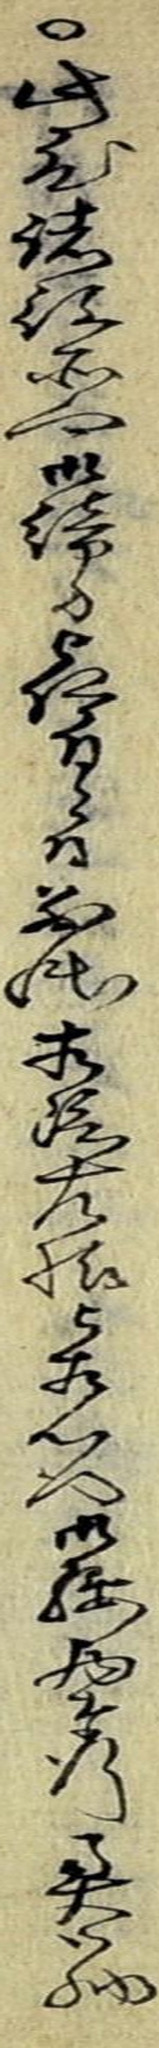○此度諸役所向御締方被仰付候に付別紙相渡左様被相心得御腰物奉行奥御納
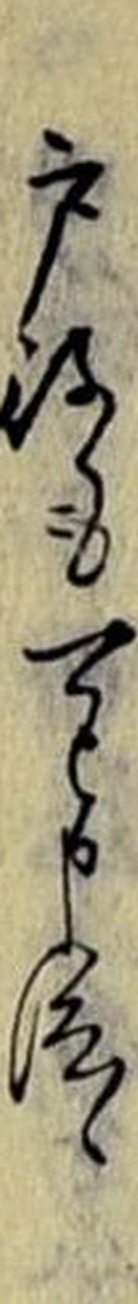戸役へも可被申渡候
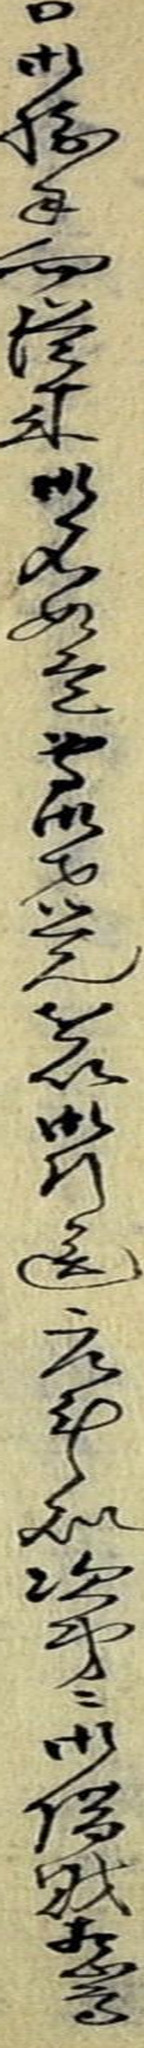○御勝手向従來御不如意専御才覚を以御引送取斗候処次第に御借財相嵩
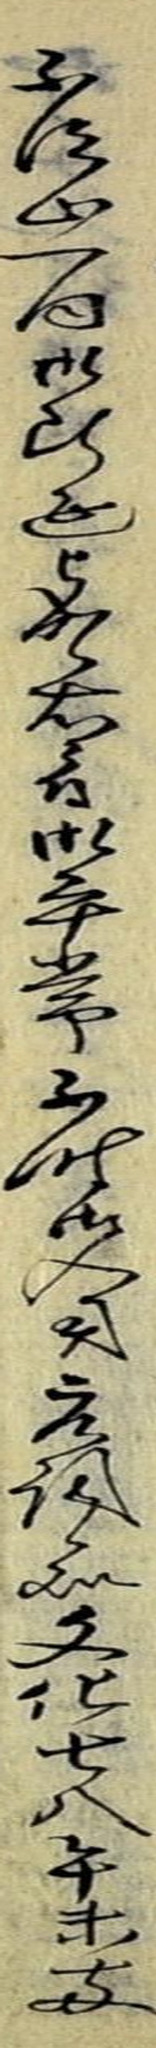不得止一同御断延被成候右に付御平常不時入用取調候処文化七八午未両
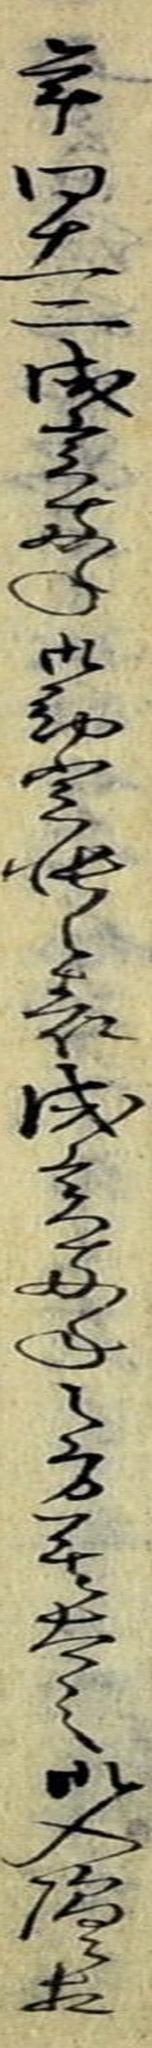年同十一二戌亥両年御勘定帳之表戌亥両年之方莫大之御入増に相
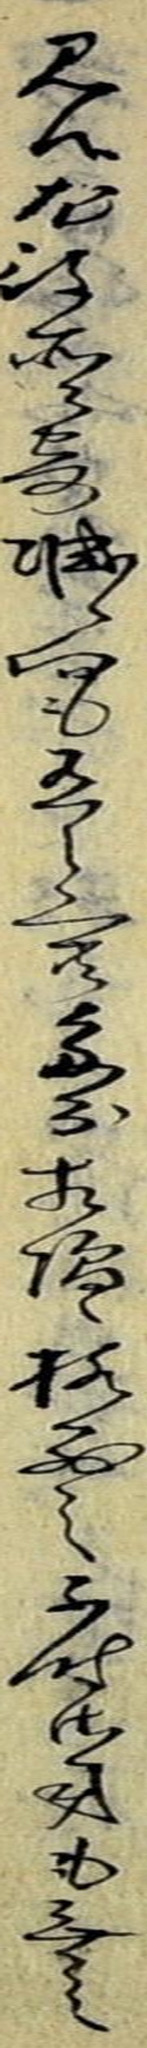見候尤役所に寄減候向も有之候へ共多分相増候格別之不時御用も無之
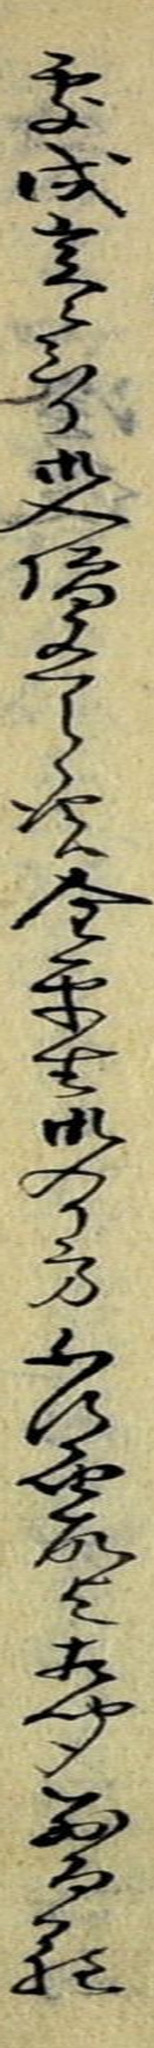処戌亥に至り御入増有之候儀は全平生御〆り方不行届故と相聞別而難
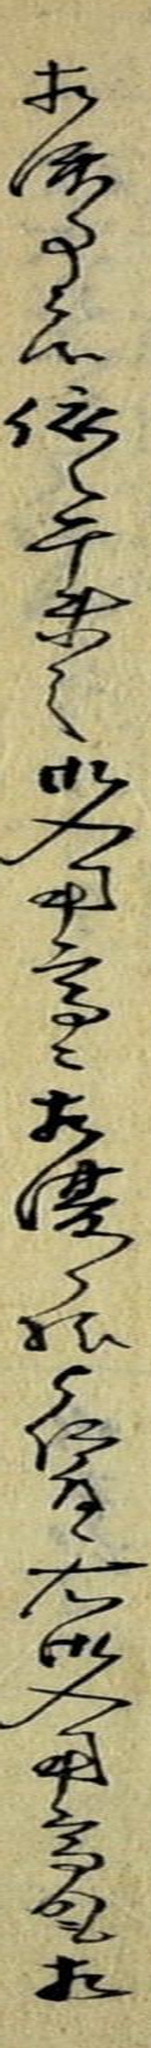相済事に候依之午未之御入用高に相復候様被仰付候右御入用高ゟも相
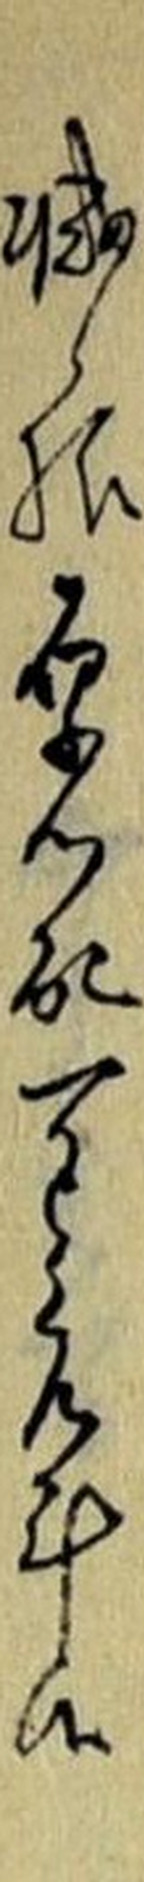減候様厚心配可被取斗候
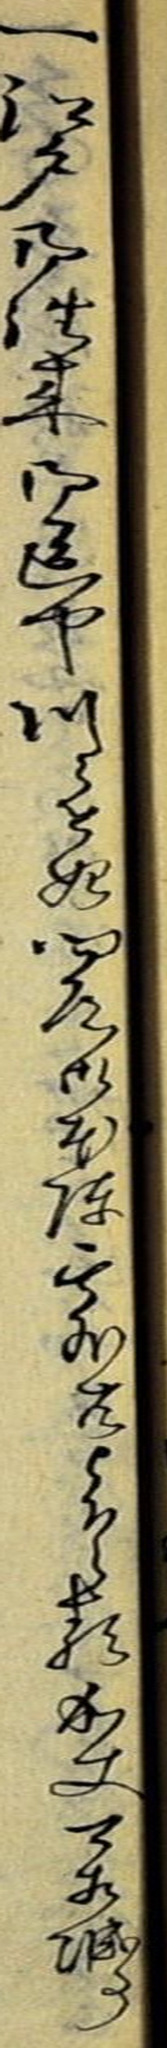一江戸御往来御道中川々を始問屋御本陣其外共被下類成丈可相減事
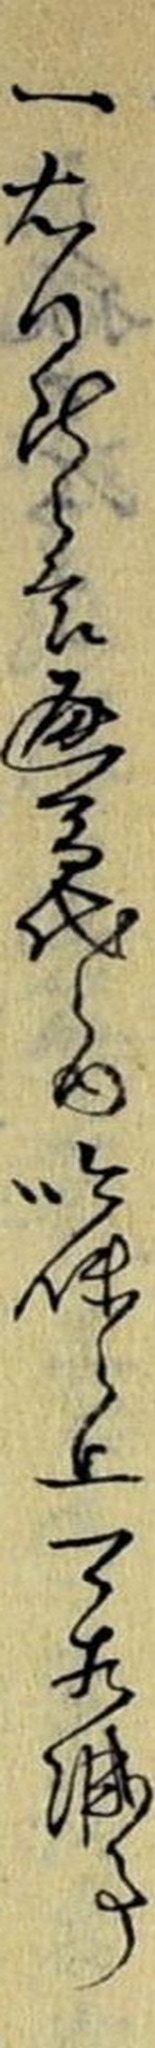一右同断之節通馬代之内吟味之上可相減事
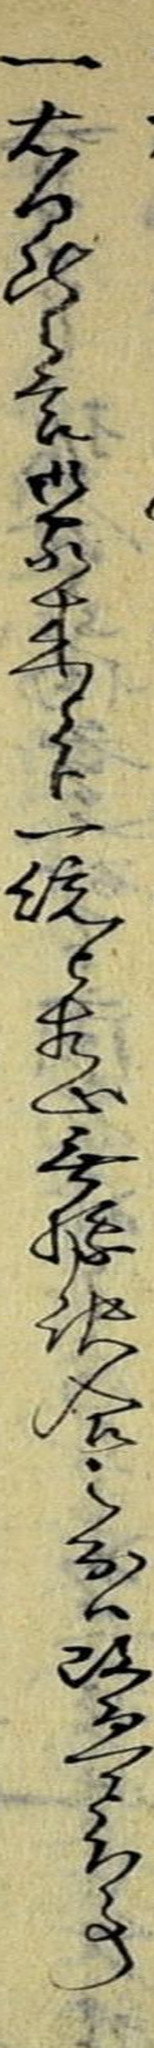一右同断之節御家来へ被下一統被相止無拠訳合之分は改而可被下事
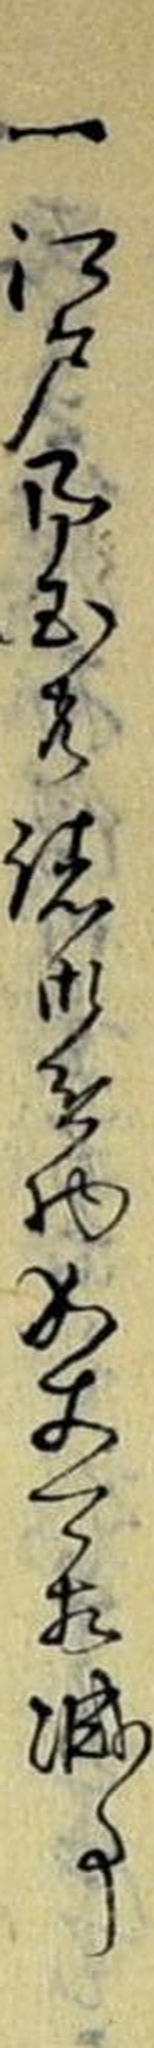一江戸御国共諸進物成丈可相減事
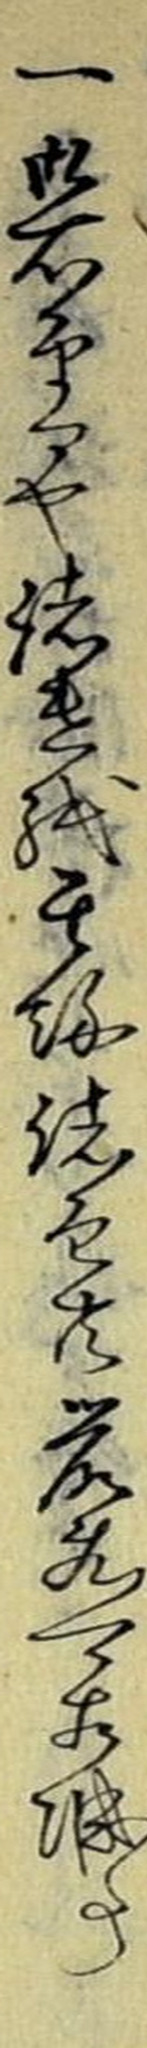一御右筆部や諸遣紙其餘諸色共厳敷可相減事
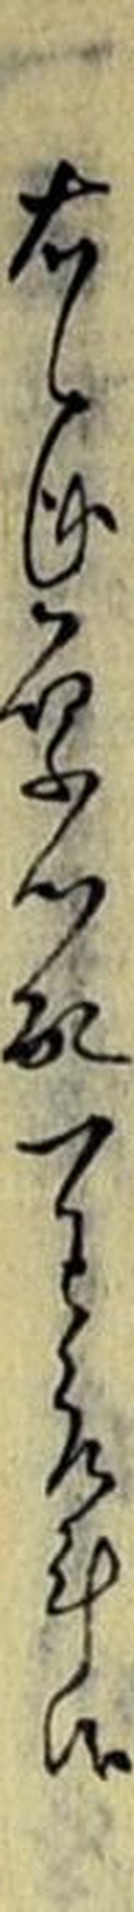右之趣厚心配可被取斗候
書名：命令之部 四
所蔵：福井県文書館 Fukui Prefectural Archives
